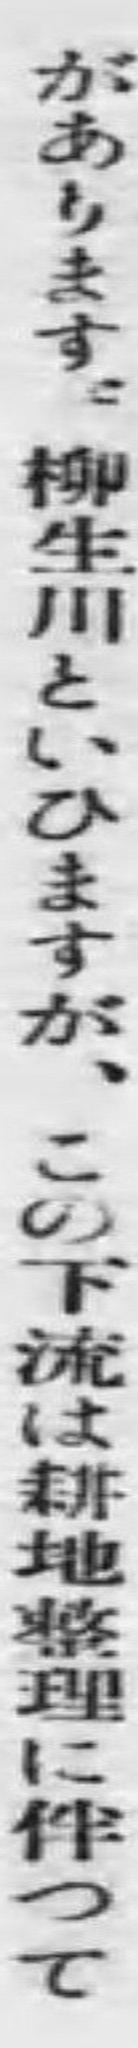があります。柳生川といひますが、この下流は耕地整理に伴つて
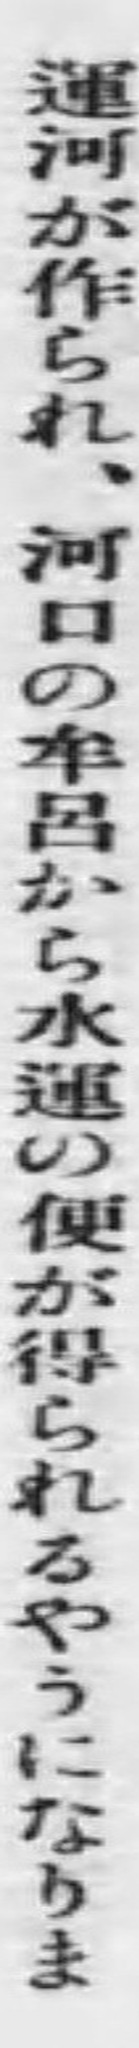運河が作られ、河口の牟呂から水運の便が得られるやうになりま

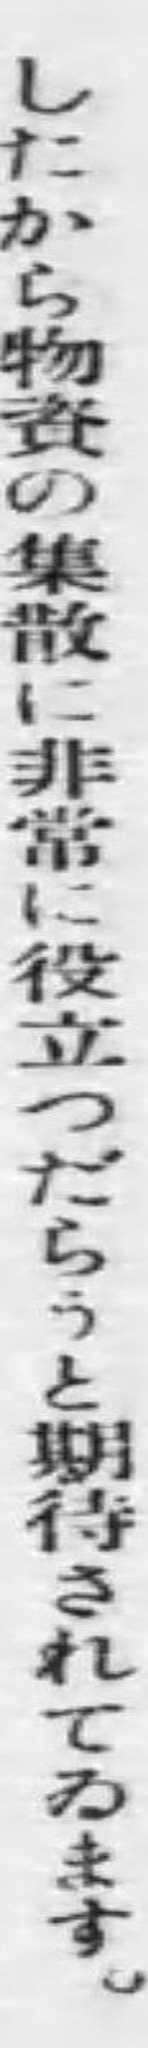したから物資の集散に非常に役立つだらうと期待されてゐます。
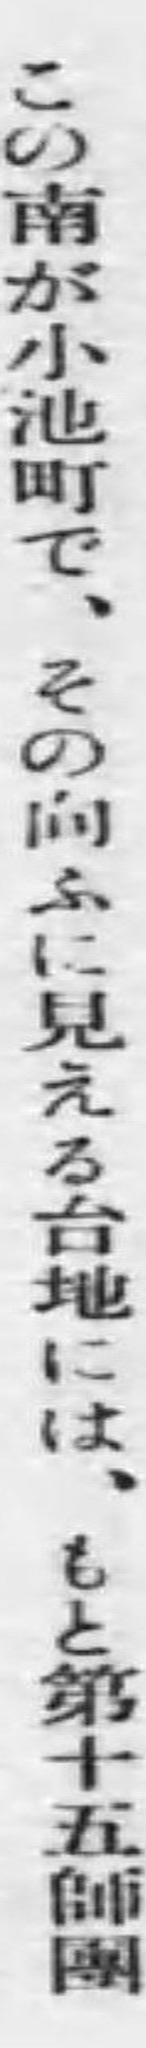この南が小池町で、その向ふに見える台地には、もと第十五師団
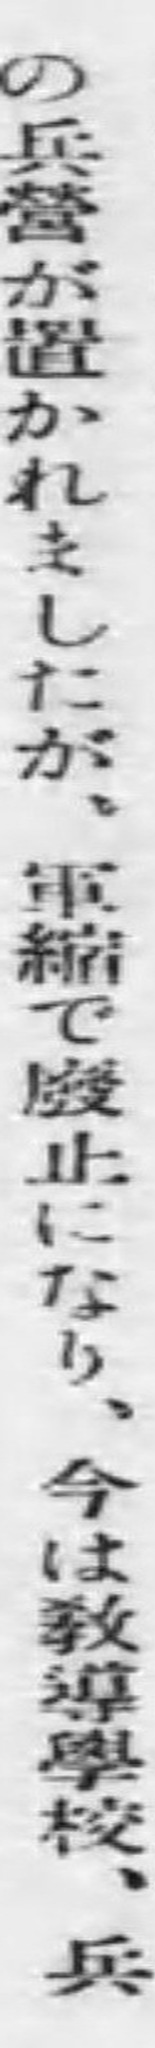の兵営が置かれましたが、軍縮で廃止になり、今は教導学校、兵
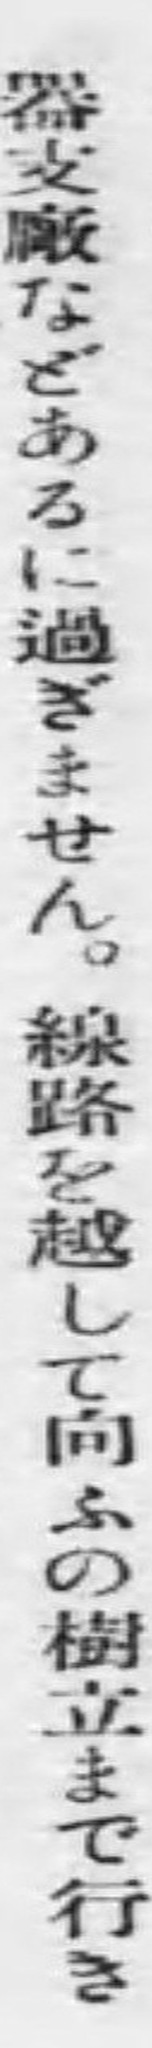器支廠などあるに過ぎません。線路を越して向ふの樹立まで行き
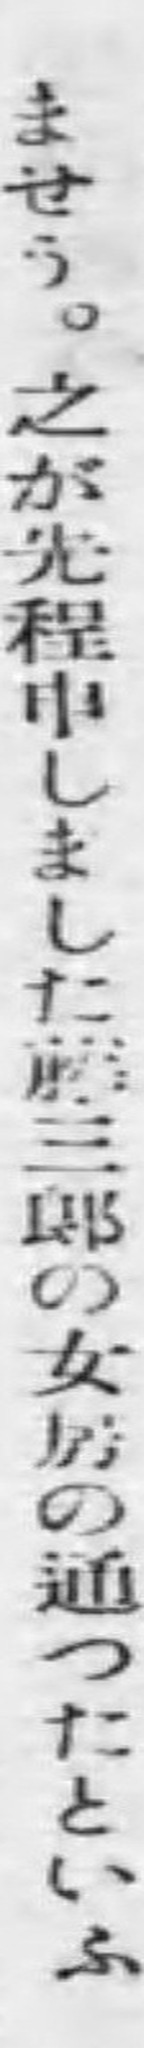ませう。之が先程申しました藤三郎の女房の通つたといふ
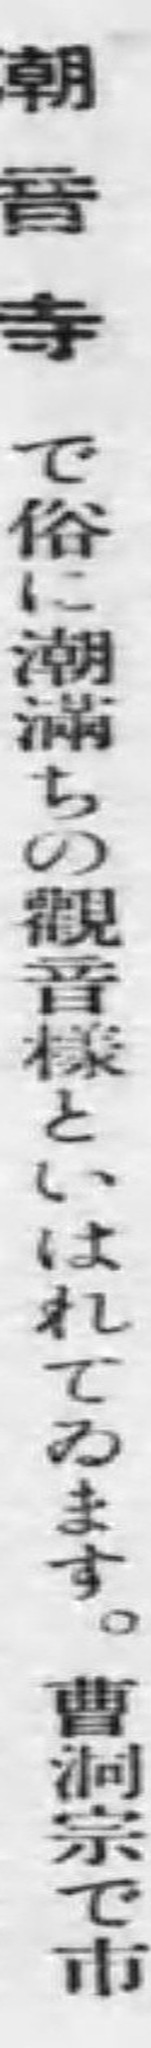潮音寺で俗に潮満ちの観音様といはれてゐます。曹洞宗で市
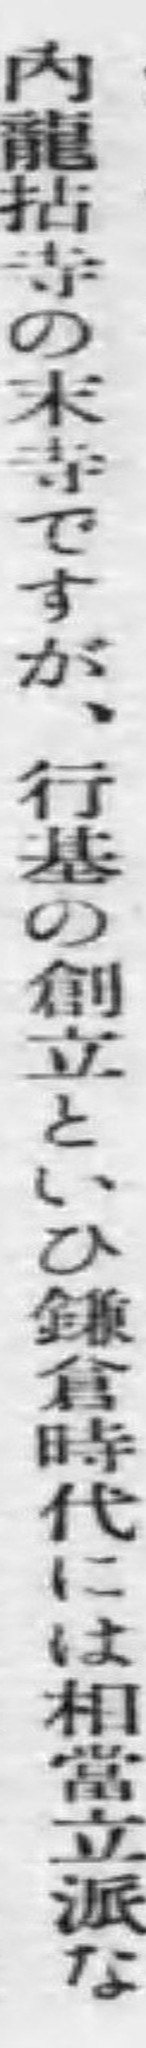内龍拈寺の末寺ですが、行基の創立といひ鎌倉時代には相当立派な
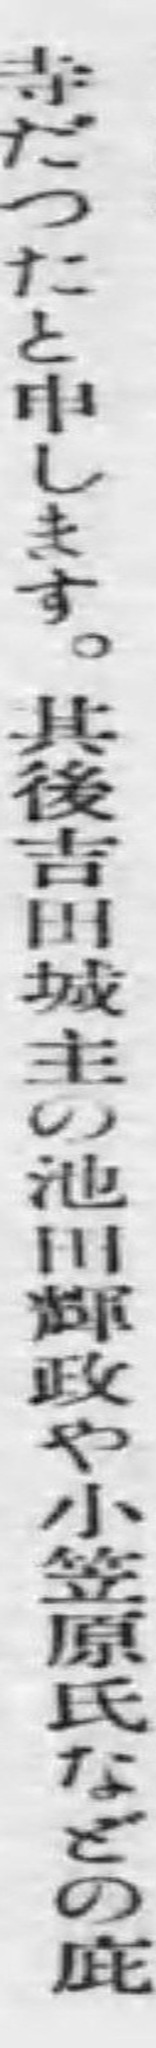寺だつたと申します。其後吉田城主の池田輝政や小笠原氏などの庇
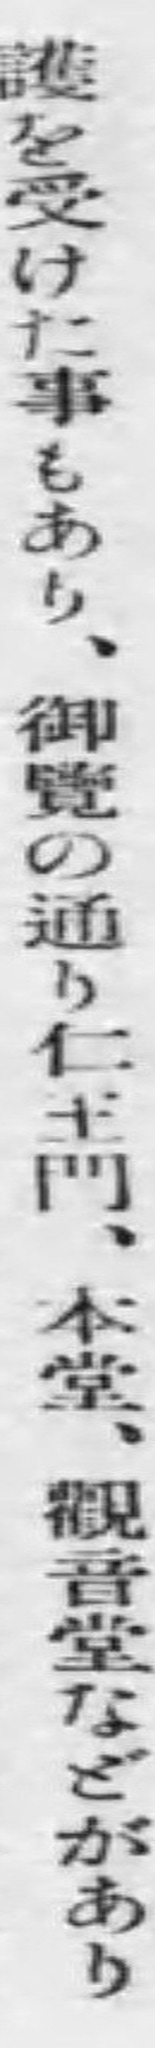護を受けた事もあり、御覧の通り仁王門、本堂、観音堂などがあり
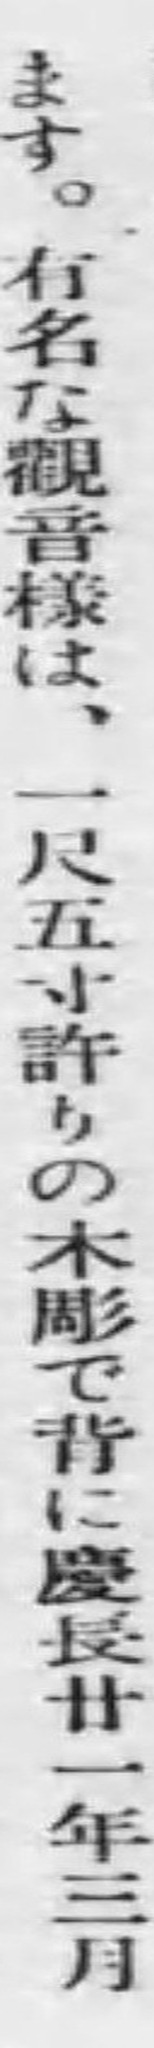ます。有名な観音様は、一尺五寸許りの木彫で背に慶長廿一年三月
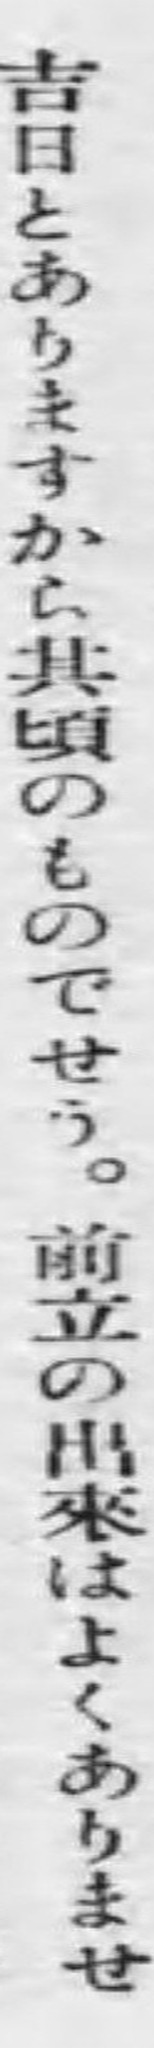吉日とありますから其頃のものでせう。前立の出来はよくありませ
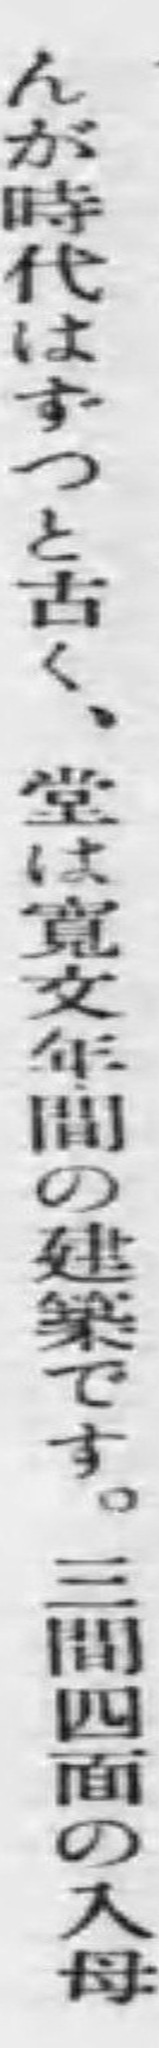んが時代はずつと古く、堂は寛文年間の建築です。三間四面の入母
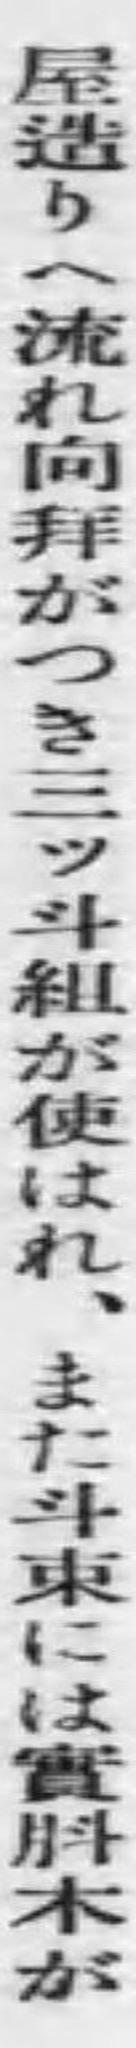屋造りへ流れ向拝がつき三ッ斗組が使はれ、また斗束には実肘木が
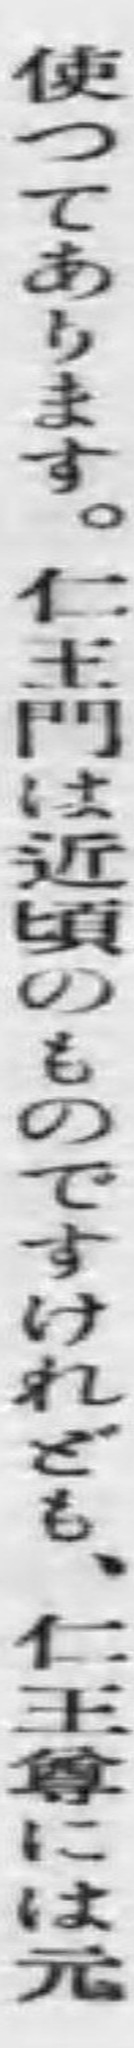使つてあります。仁王門は近頃のものですけれども、仁王尊には元
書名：東三河道中記 : 豊橋市及其附近案内
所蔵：国立国会図書館 National Diet Library, JAPAN
